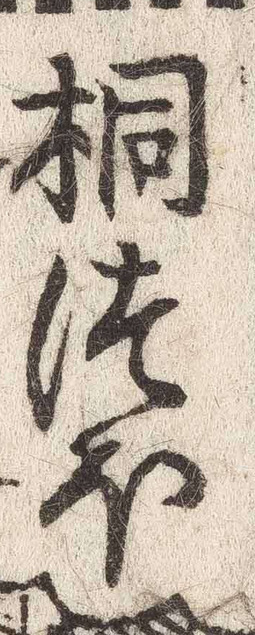桐つほ

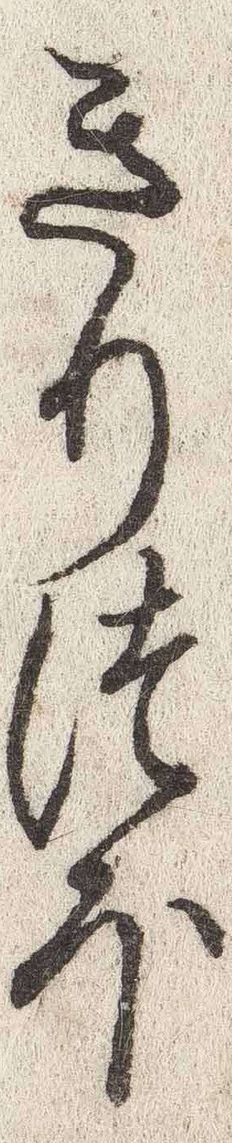きりつほ
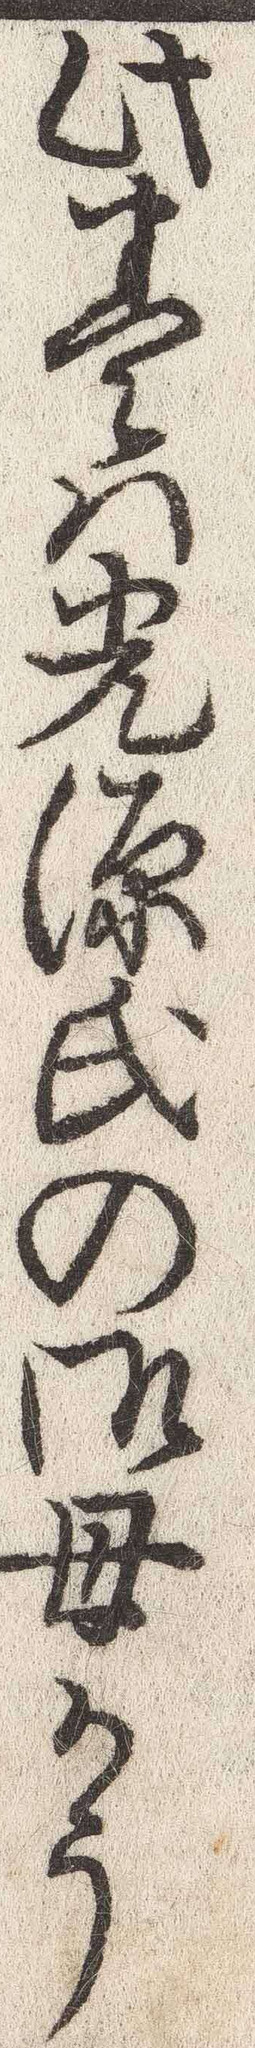此巻は光源氏の御母かう
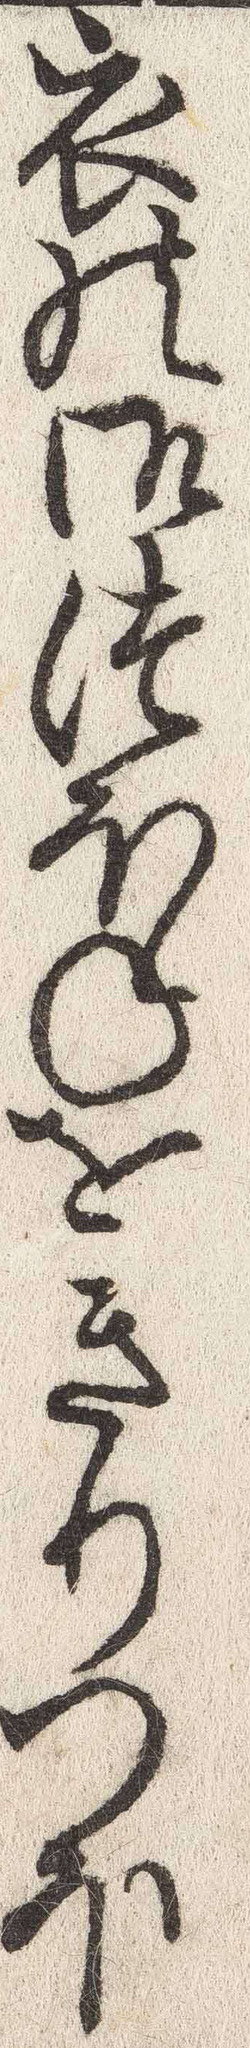衣の御つほねをきりつほ
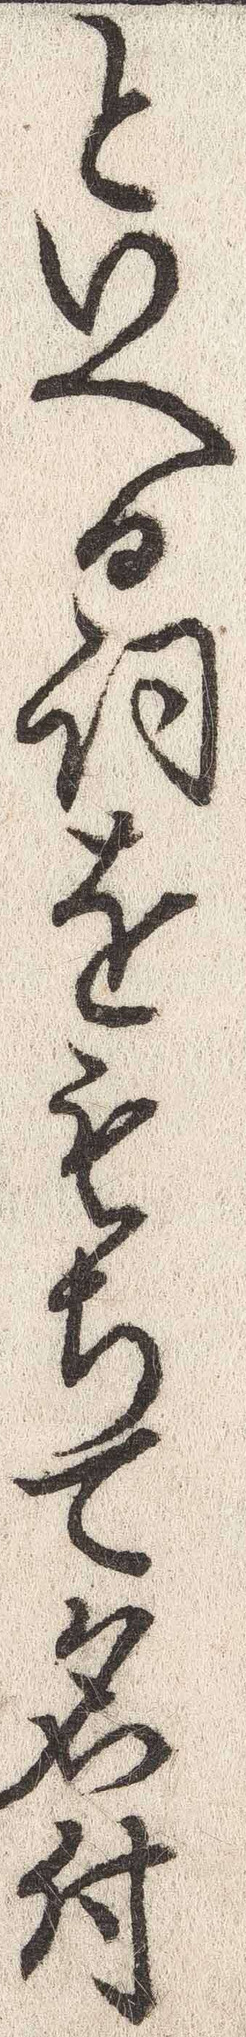といへる詞をもちて名付
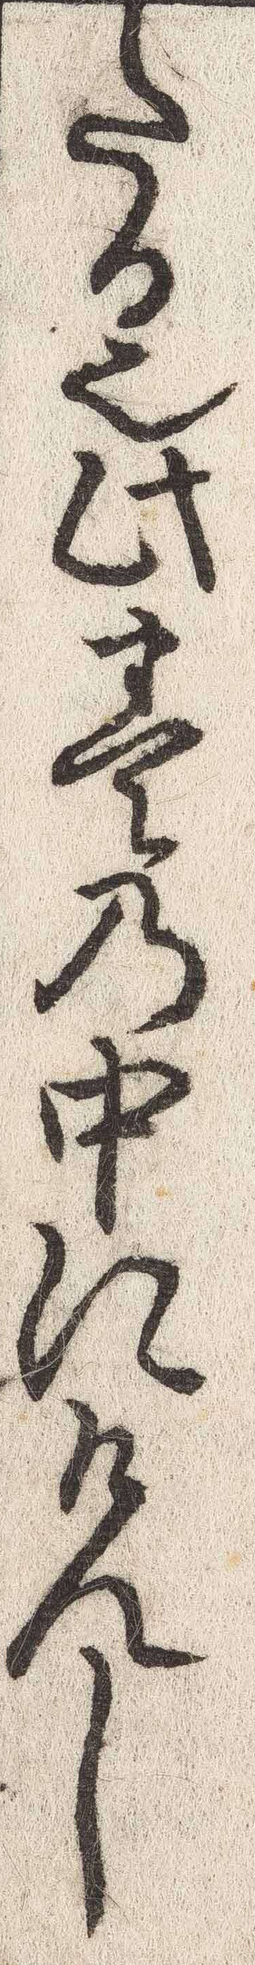たる也此巻の中にけんし
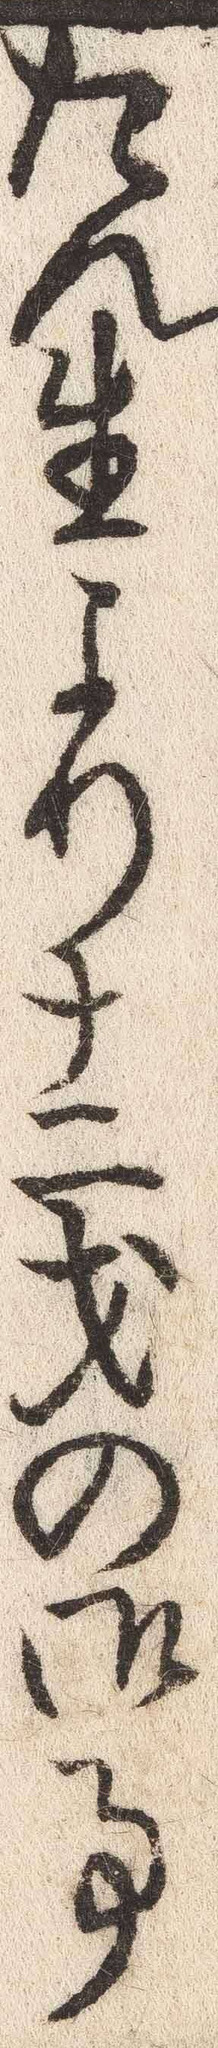たん生より十二才の御事
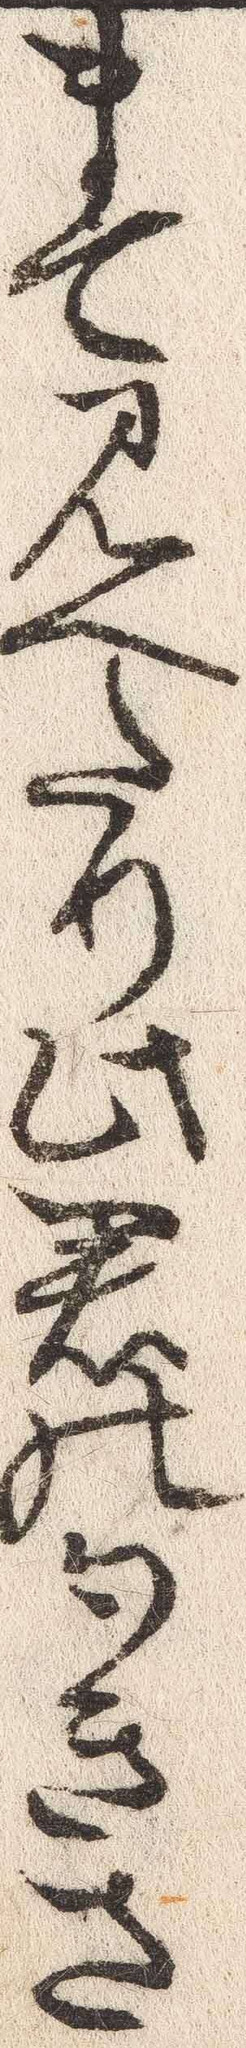まて見へたり此君の御きさ
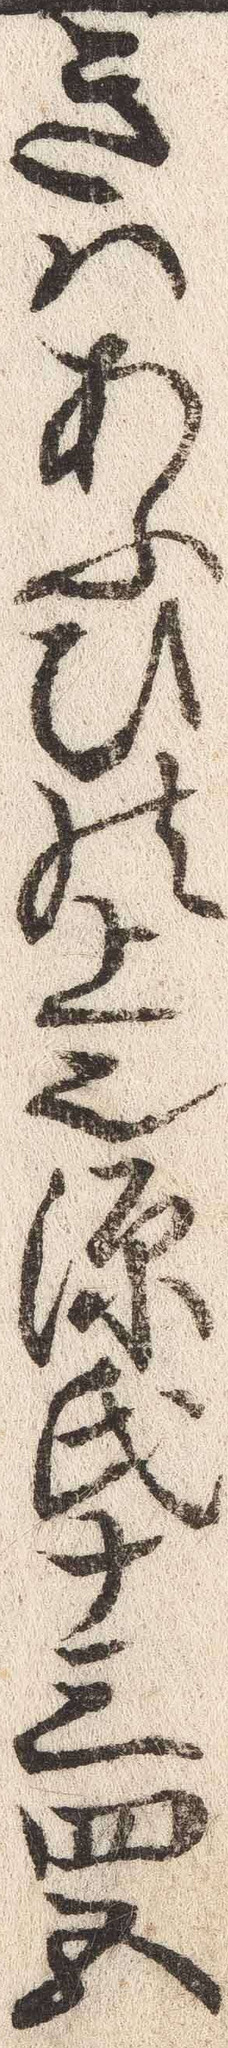きはあふひの上也源氏十三四五
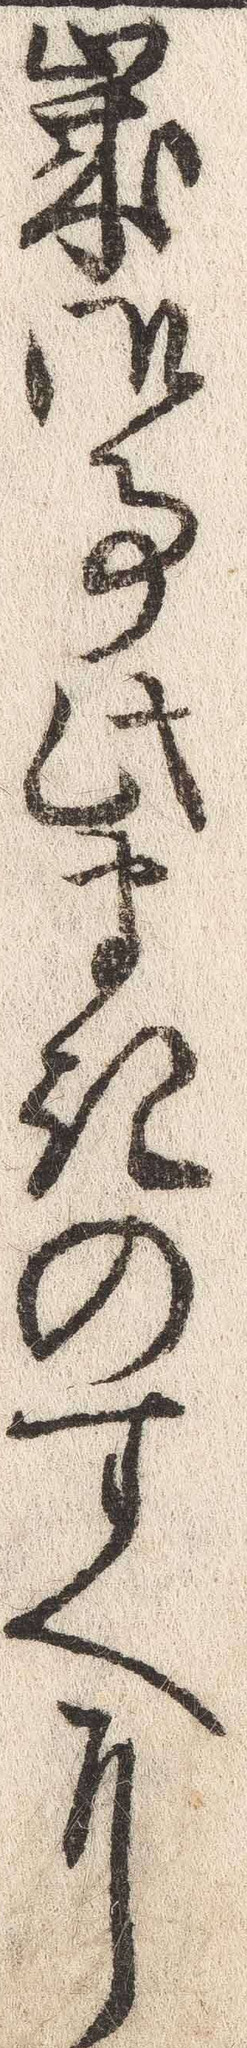歳御事此まきのすへに
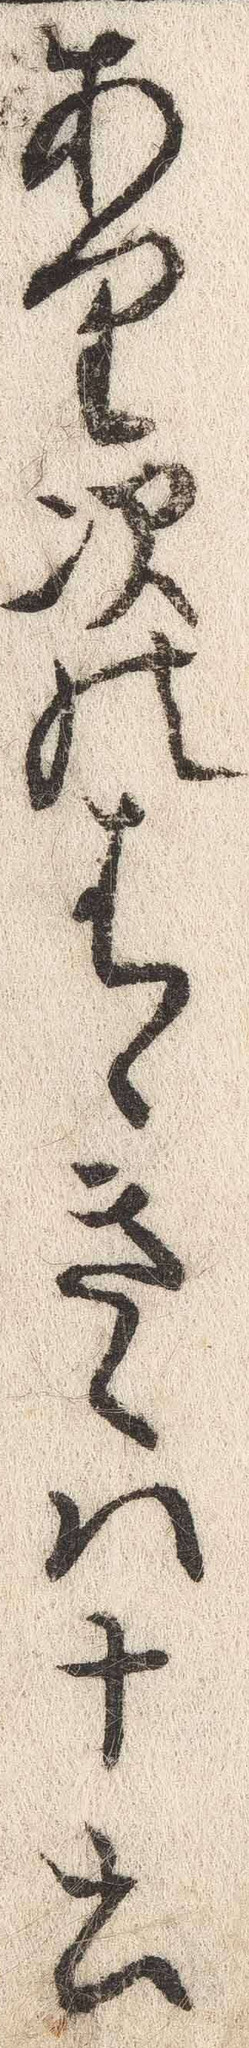あり次のはゝきゝは十六

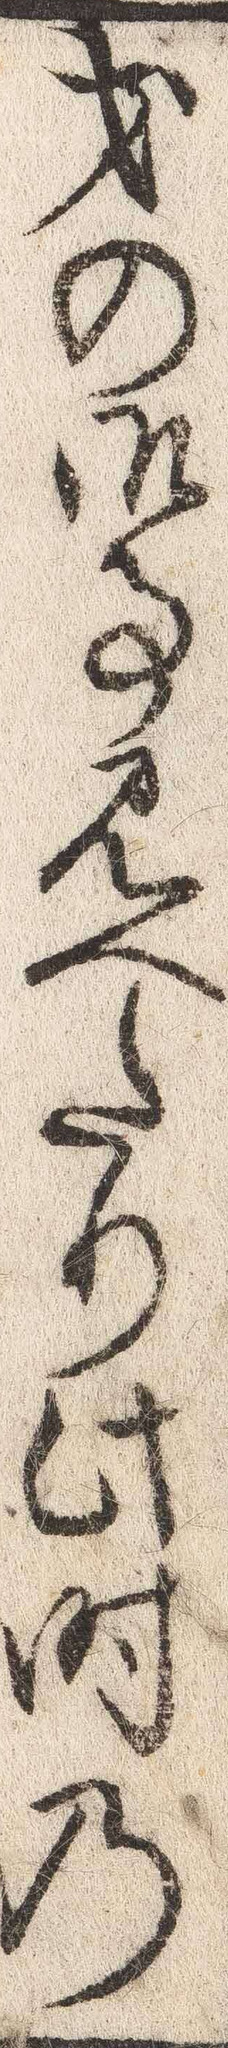才の御事見へたり此時の
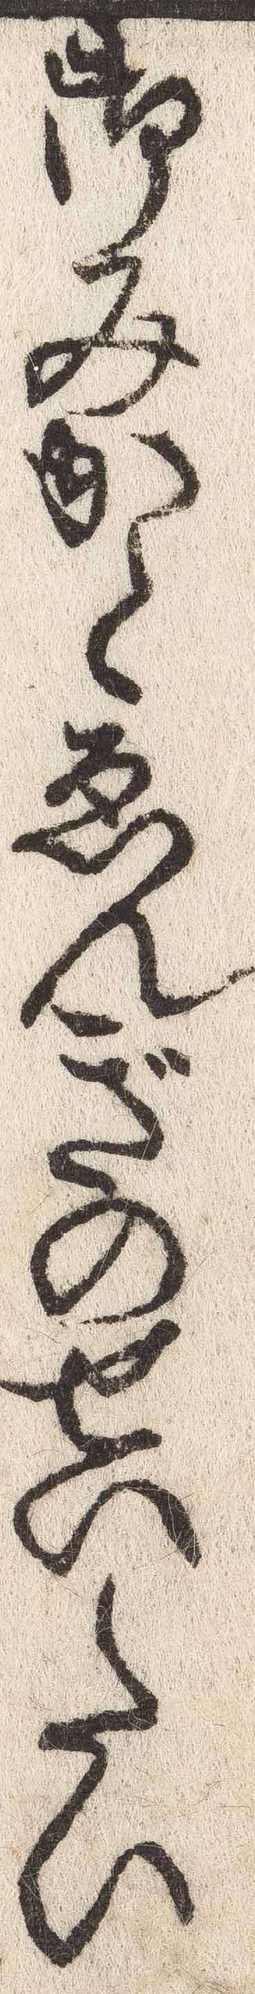御みかとゑんぎのせいたい
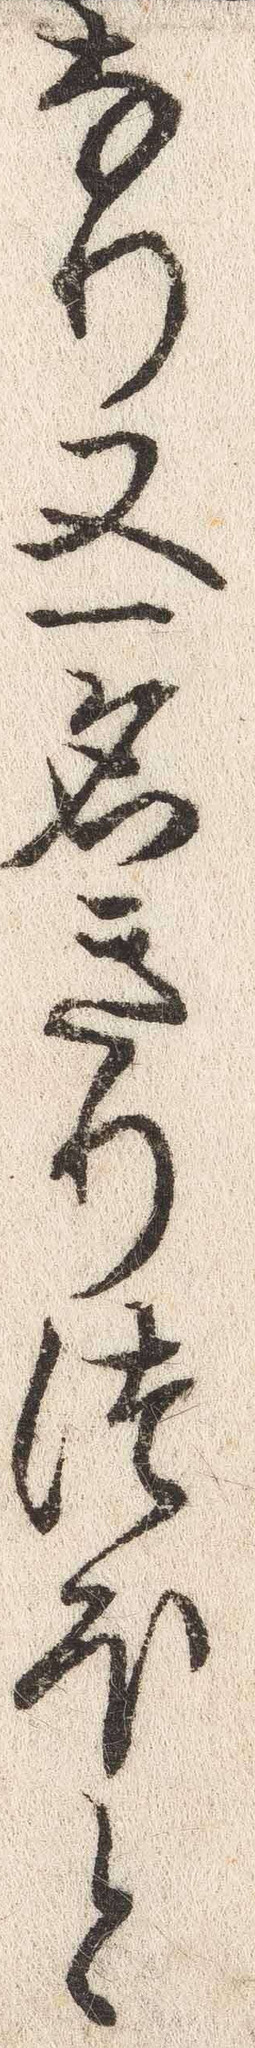なり又一名きりつほと
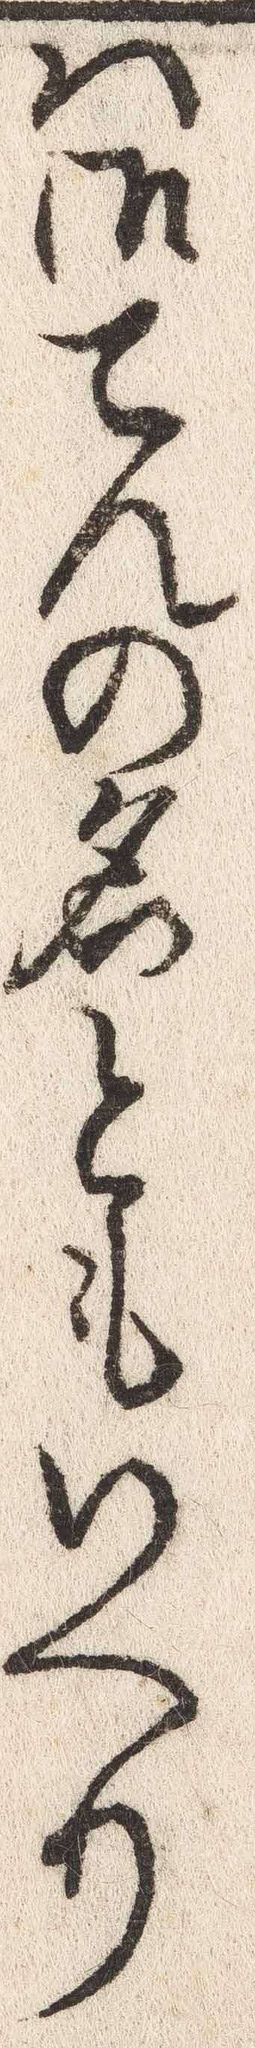は御てんの名ともいへり
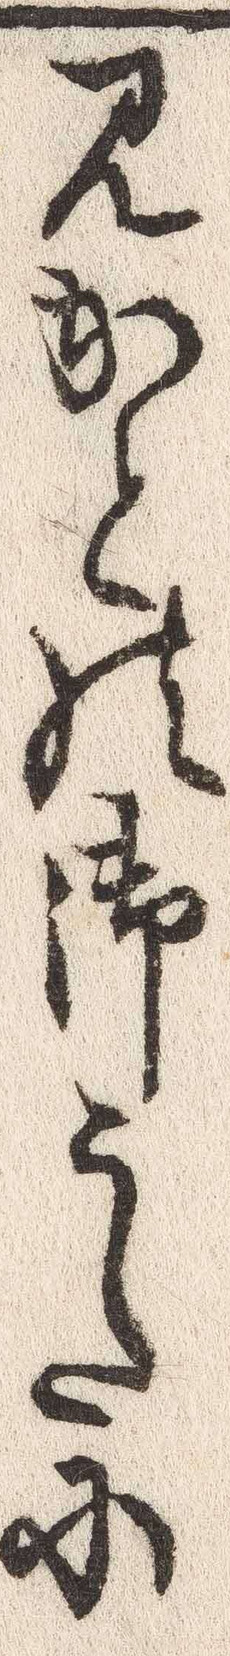みかとの御うたに
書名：源氏物語
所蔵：東京学芸大学附属図書館 国文学研究資料館
